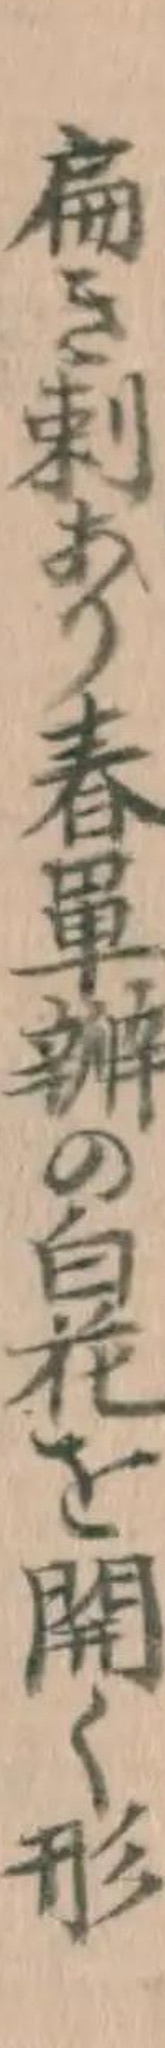扁き剌あり春単弁の白花を開く形
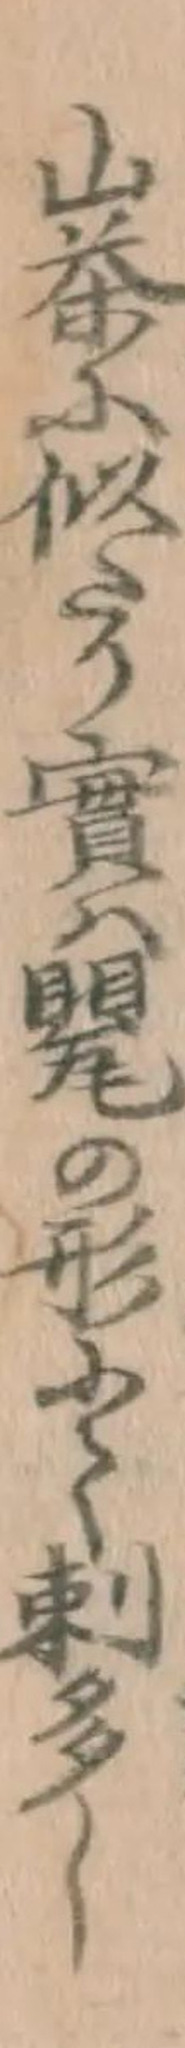山茶に似たり実は甖の形にて剌多し
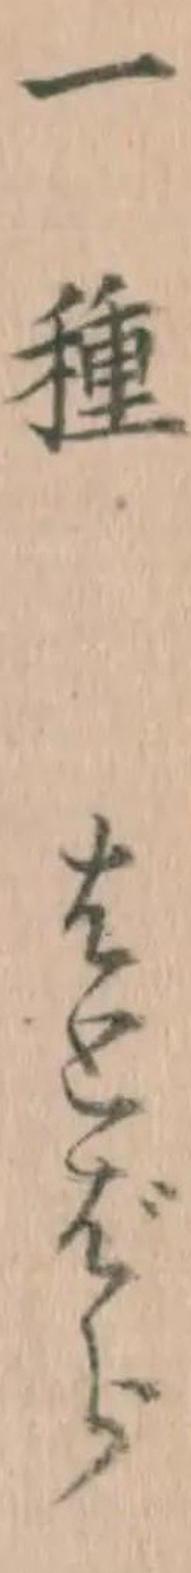一種はとばら
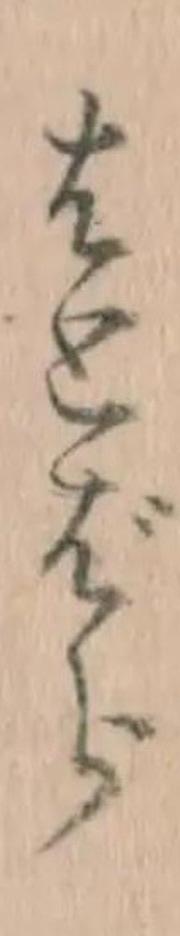はとはら
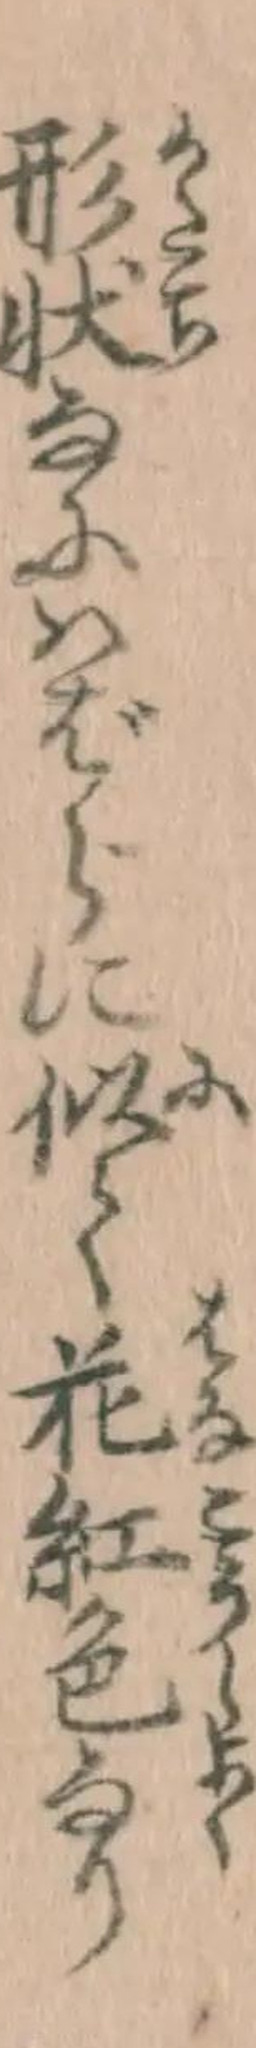形状なにはばらに似て花紅色なり
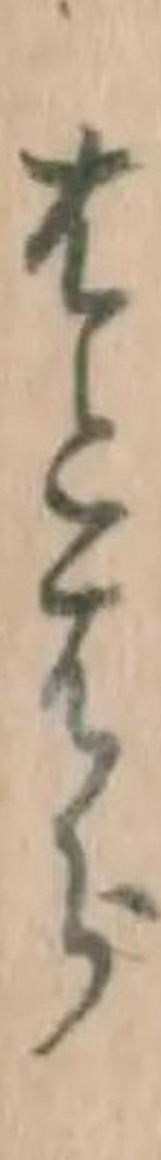はとはら

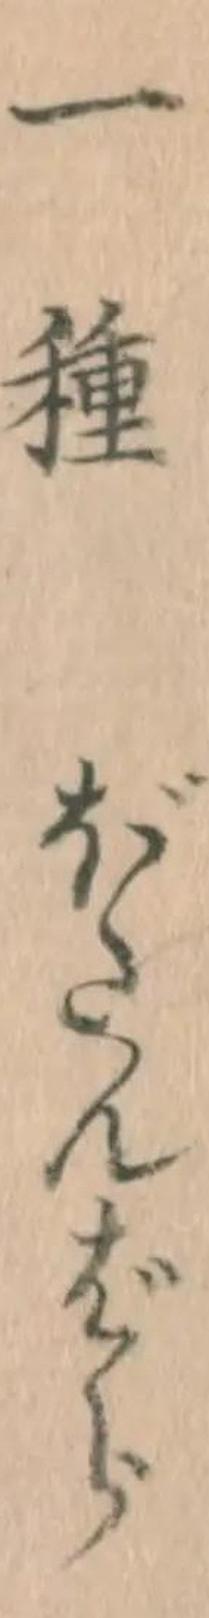一種ぼたんばら
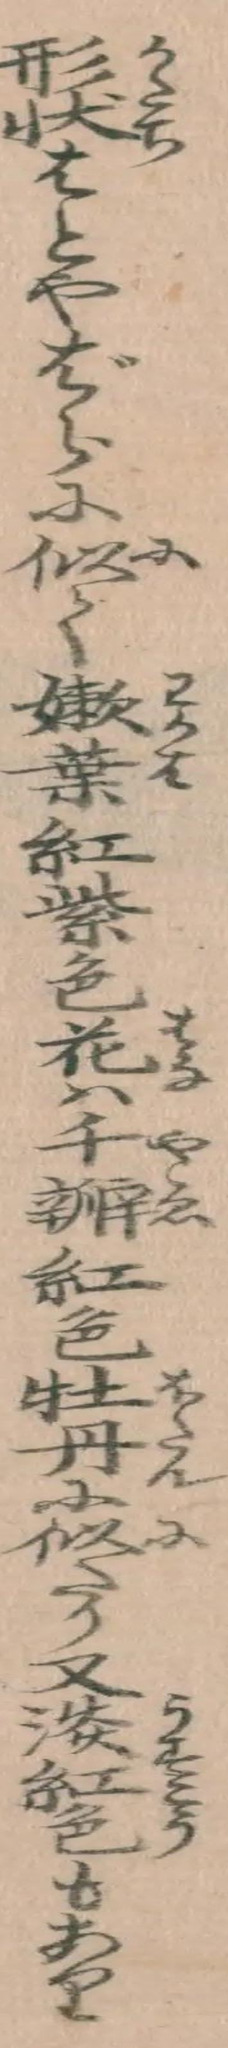形状はとやばらに似て嫩葉紅紫色花は千弁紅色牡丹に似たり又淡紅色もあり
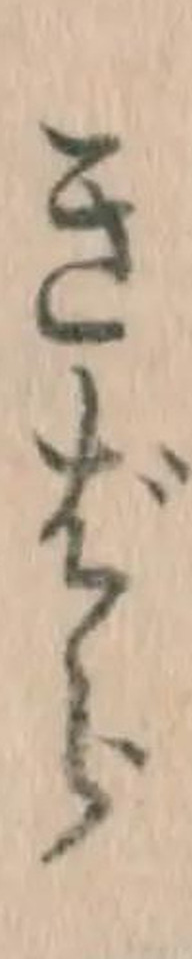きはら
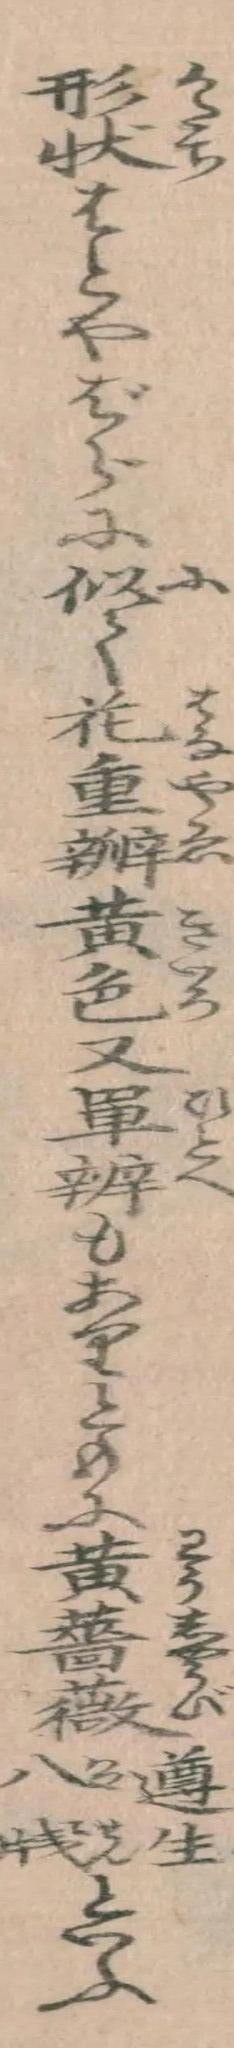形状はとやばらに似て花重弁黄色又単弁もありともに黄薔薇遵生八牋といふ
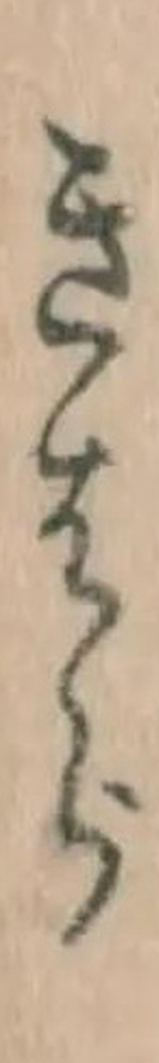きはら

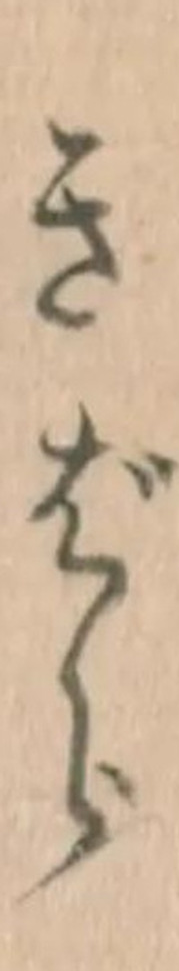きばら
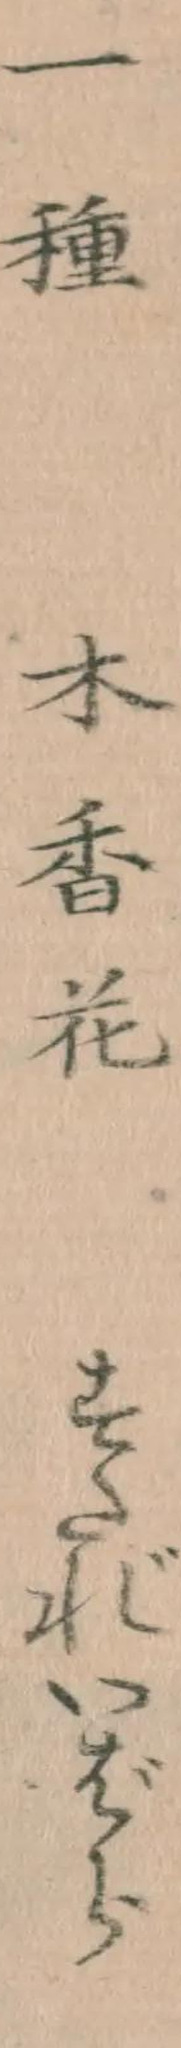一種木香花すだれいばら
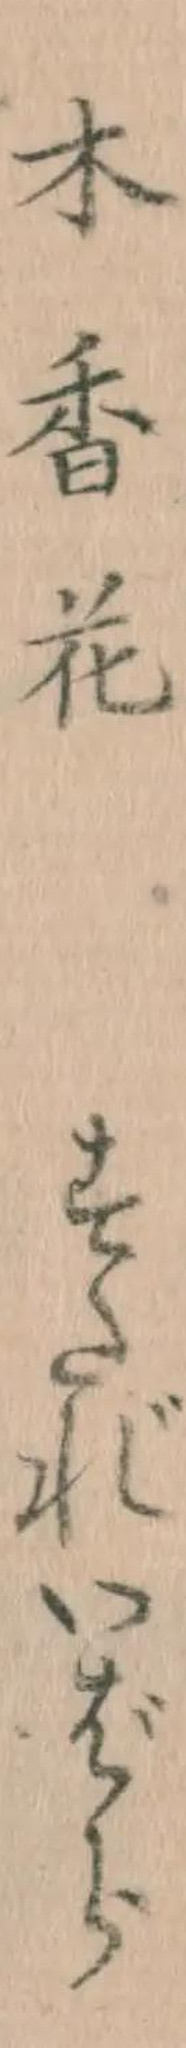一種木香花すだれいばら
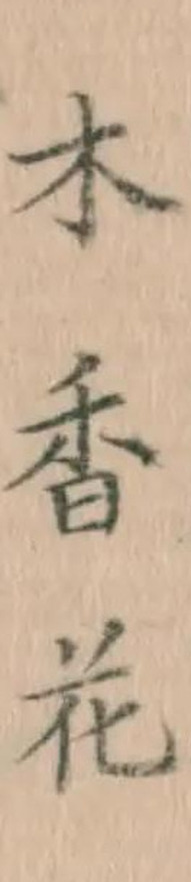木香花
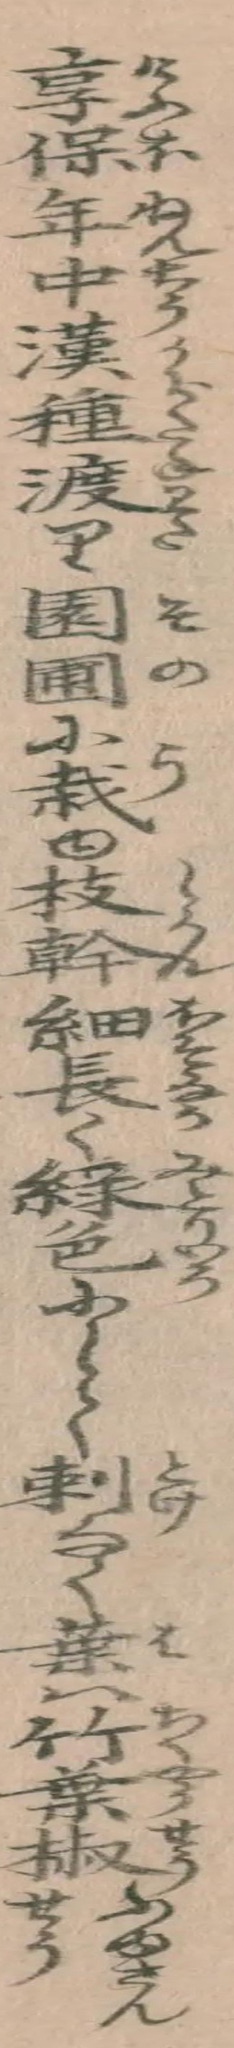享保年中漢種渡り園圃に栽ゆ枝幹細長く緑色にして剌なく葉は竹葉椒ふゆさんせう
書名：本草図譜. 巻25-27
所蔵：国立国会図書館 National Diet Library, JAPAN
